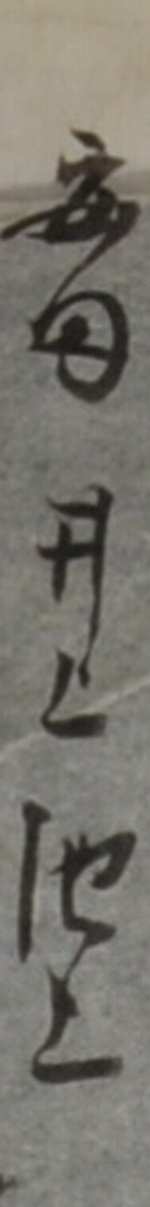「安田井上池上
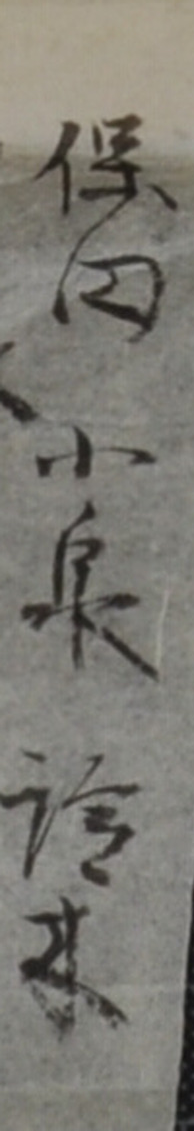「保田小泉鈴木
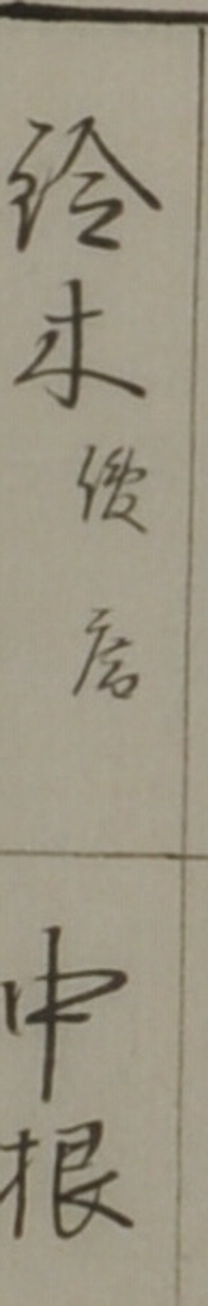鈴木俊庵中根

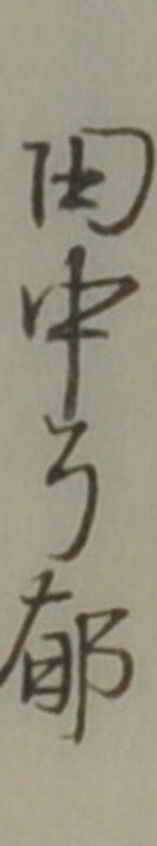田中了郁
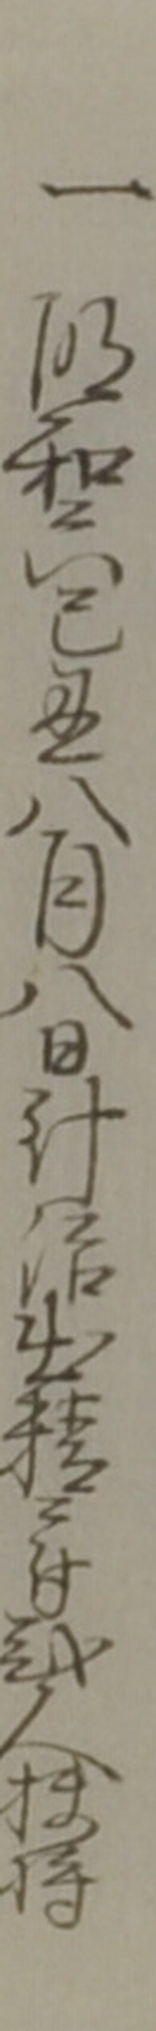一明和六己丑八月八日針治出精ニ付弐人扶持
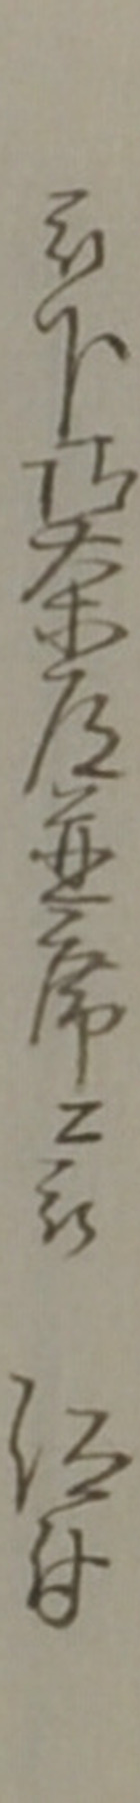被下御茶道並席ニ被仰付
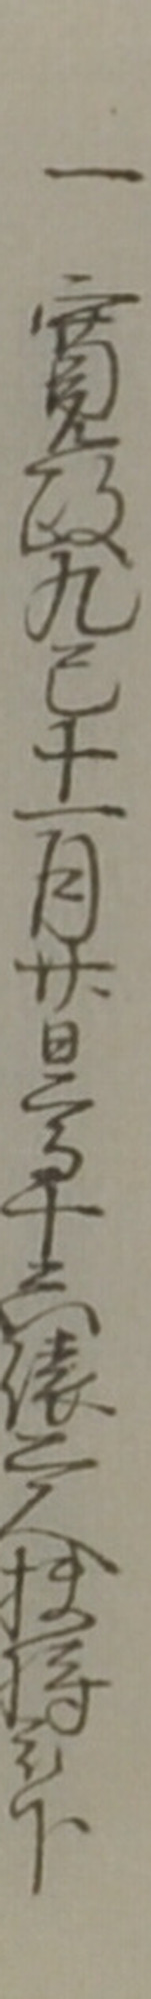一寛政九巳年十一月廿日高十六俵二人扶持被下
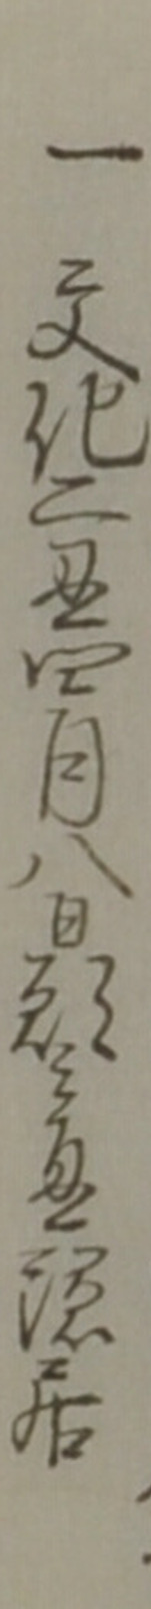一文化二丑四日八日願之通隠居
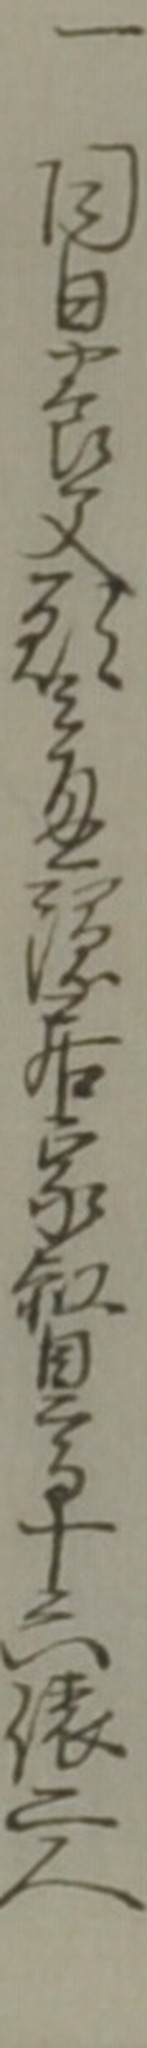一同日養父願之通隠居家督高十六俵二人
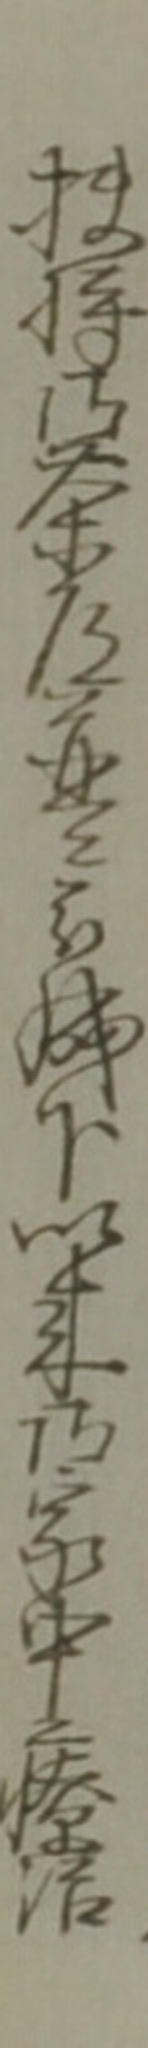扶持御茶道並ニ被成下以来御家中療治
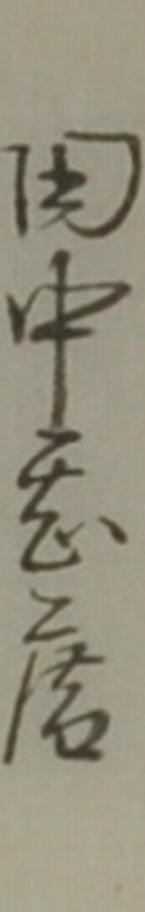田中甚庵
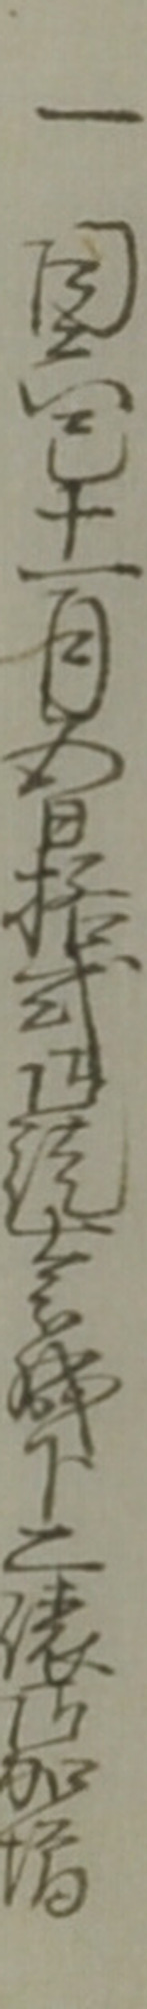一同六巳十一月五日格式御徒士被成下二俵御加増
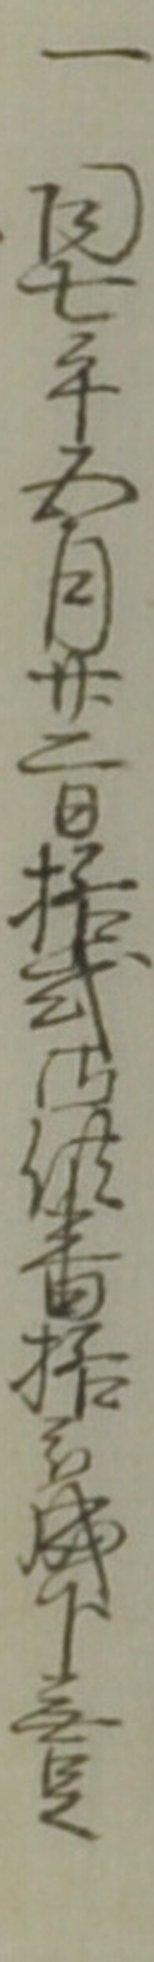一同七午五月廿二日格式御供番格被成下無足
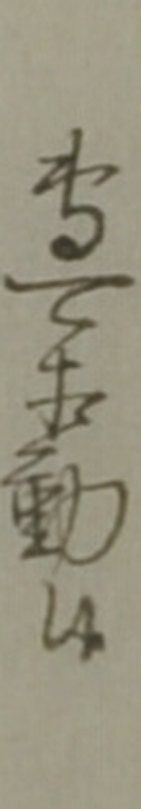専可相勤候

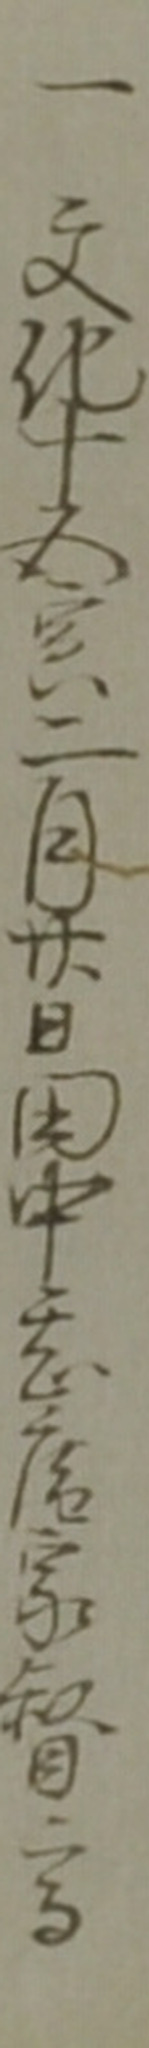一文化十五寅二月廿日田中甚庵家督高
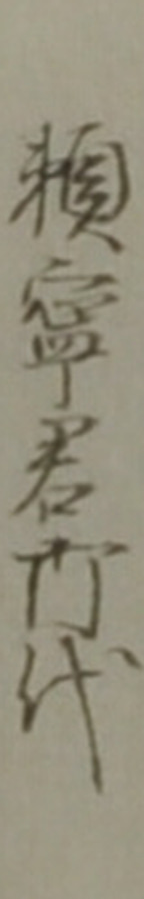頼寧君御代
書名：無足諸士勤仕録（二）
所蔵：伊那市立高遠町図書館・合同会社AMANE
